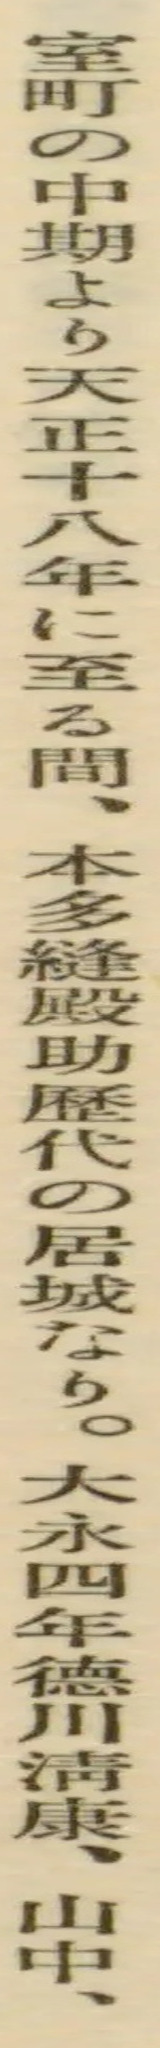室町の中期より天正十八年に至る間、本多縫殿助歴代の居城なり。大永四年徳川清康、山中、
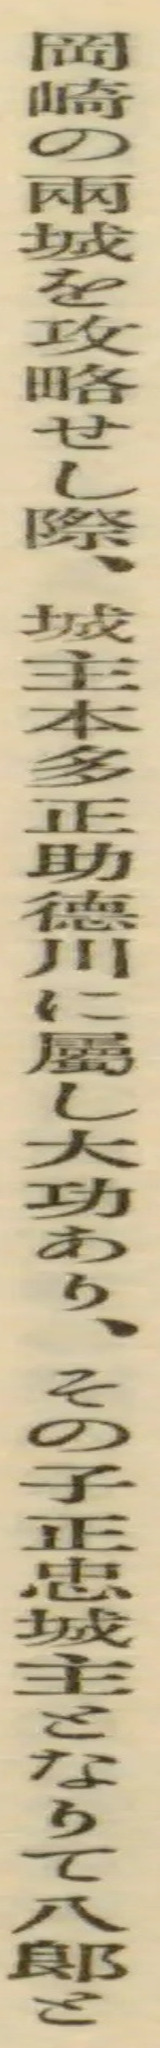岡崎の両城を攻略せし際、城主本多正助徳川に属し大功あり、その子正忠城主となりて八郎と
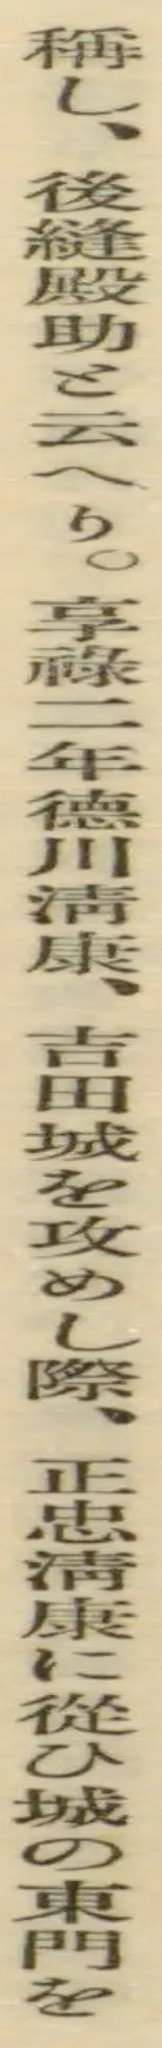称し、後縫殿助と云へり。享禄二年徳川清康、吉田城を攻めし際、正忠清康に従ひ城の東門を
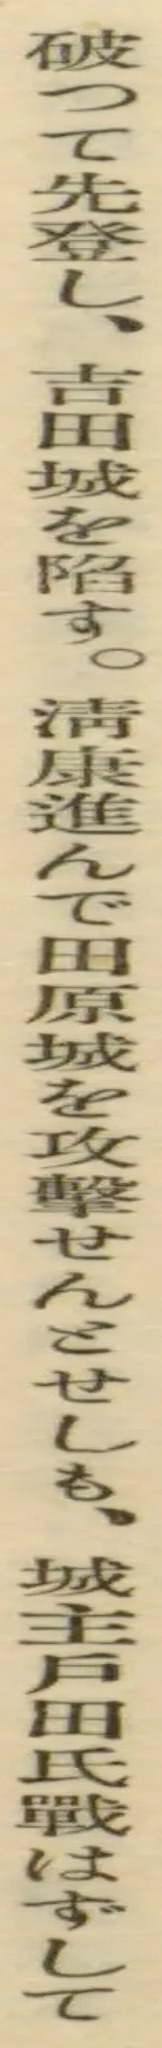破つて先登し、吉田城を陥す。清康進んで田原城を攻撃せんとせしも、城主戸田氏戦はずして
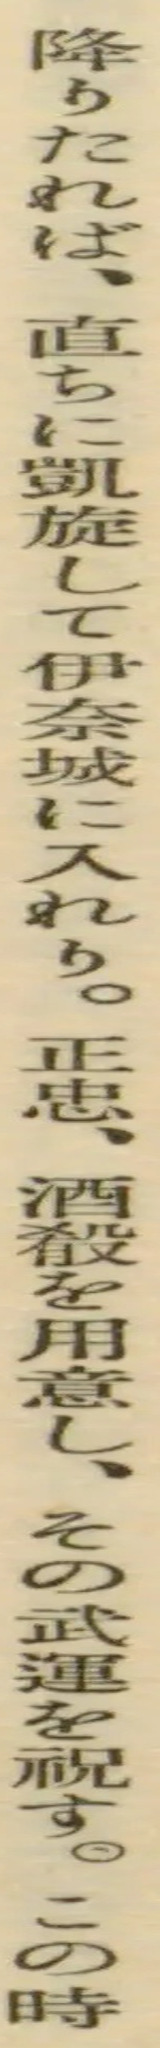降りたれば、直ちに凱旋して伊奈城に入れり。正忠、酒殽を用意し、その武運を祝す。この時
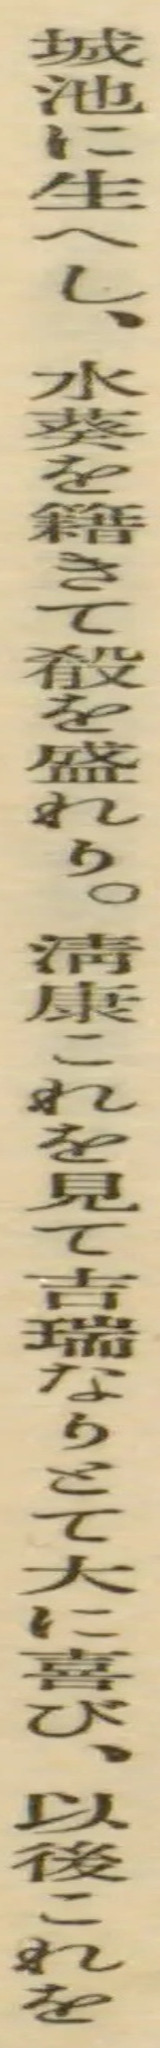城池に生へし、水葵を籍きて殽を盛れり。清康これを見て吉瑞なりとて大に喜び、以後これを

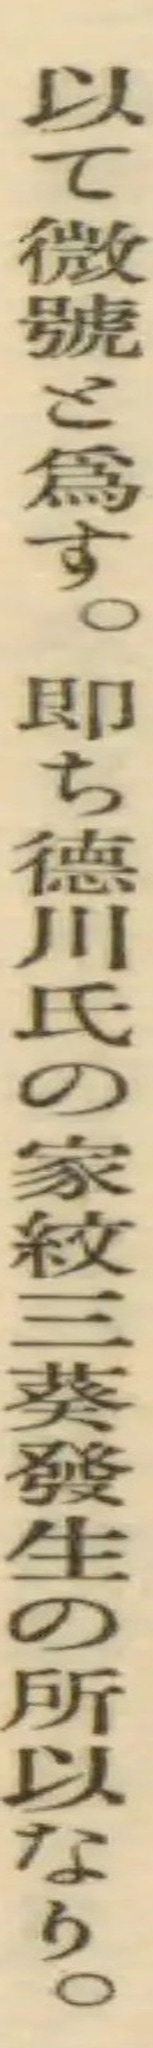以て微号と為す。即ち徳川氏の家紋三葵発生の所以なり。
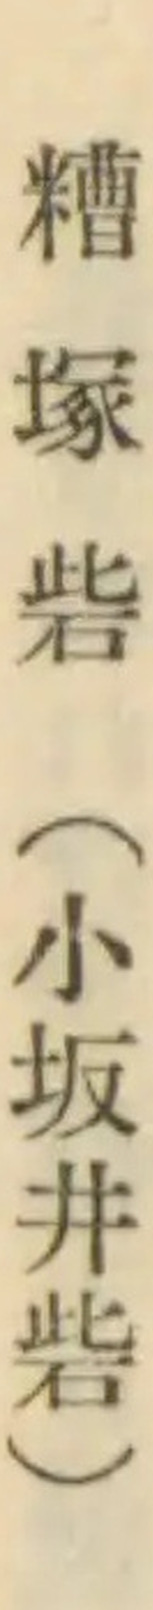糟塚砦(小坂井砦)
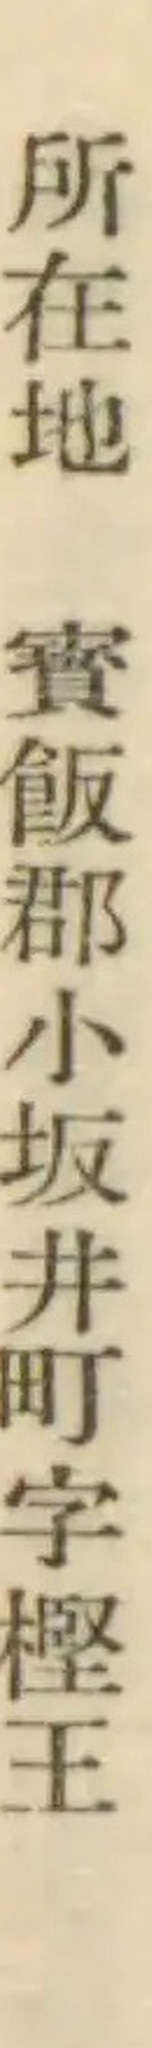所在地宝飯郡小坂井町字樫王
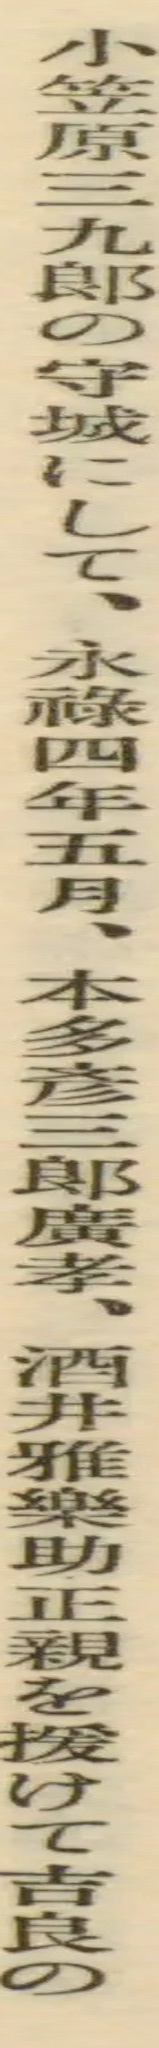小笠原三九郎の守城にして、永禄四年五月、本多彦三郎広孝、酒井雅樂助正親を援けて吉良の
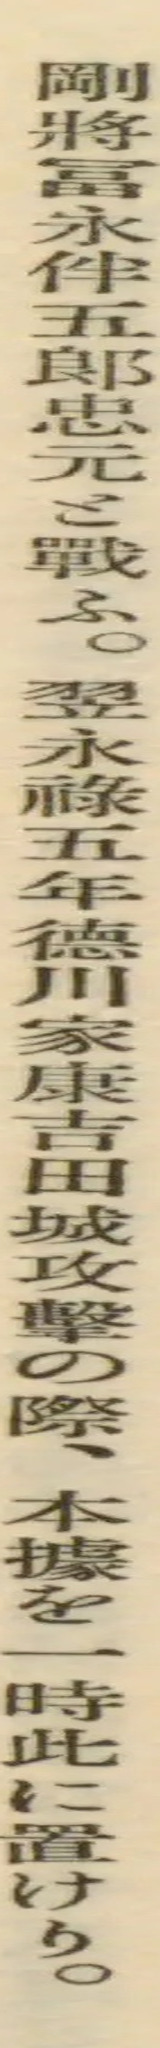剛将冨永伴五郎忠元と戦ふ。翌永禄五年徳川家康吉田城攻撃の際、本拠を一時此に置けり。
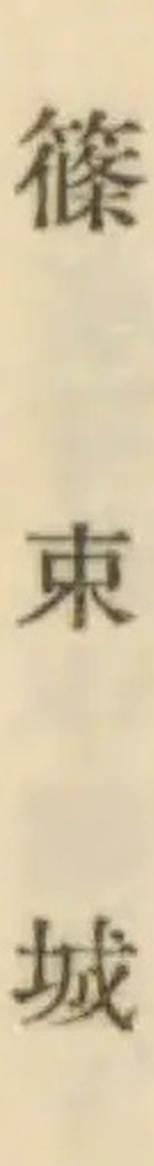篠束城
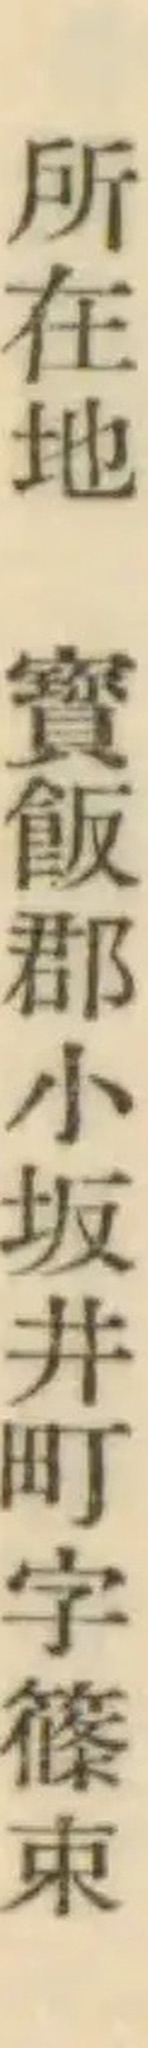所在地宝飯郡小坂井町字篠束
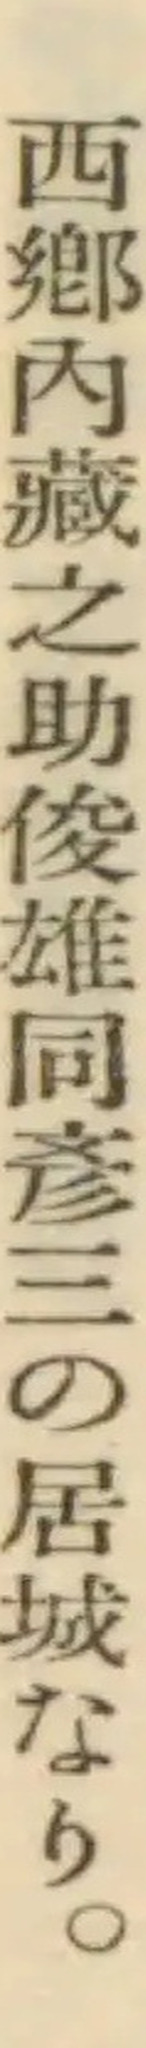西郷内蔵之助俊雄同彦三の居城なり。
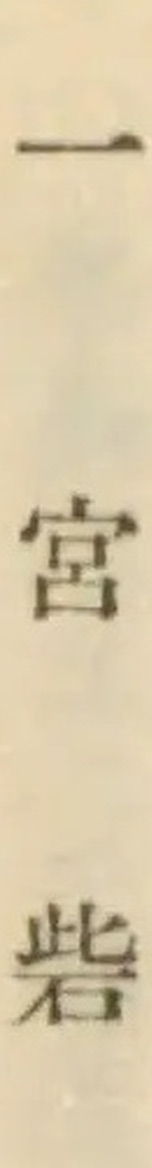一宮砦
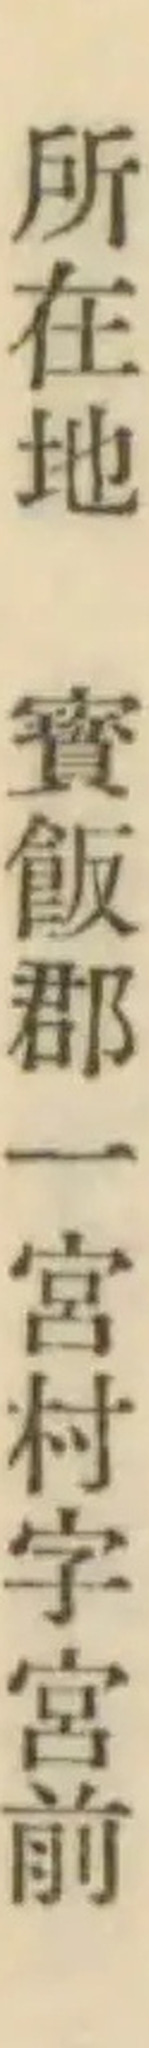所在地宝飯郡一宮村字宮前
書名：東三河之古城
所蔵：国立国会図書館 National Diet Library, JAPAN
